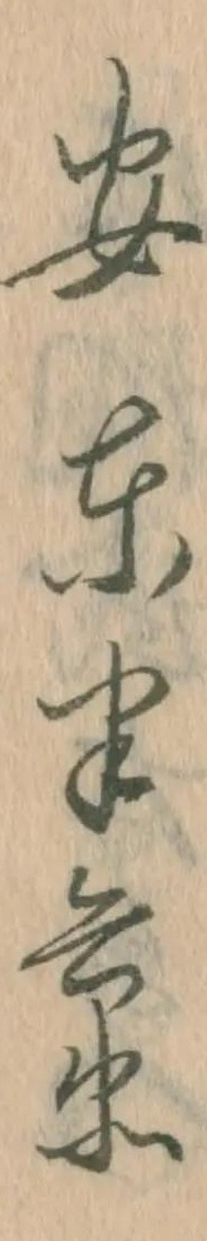安東半兵衛
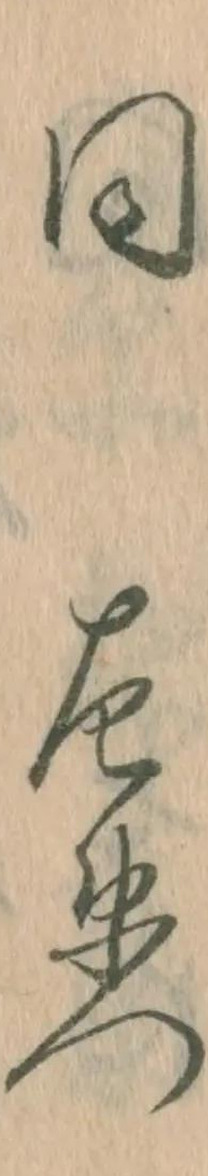同左衛門
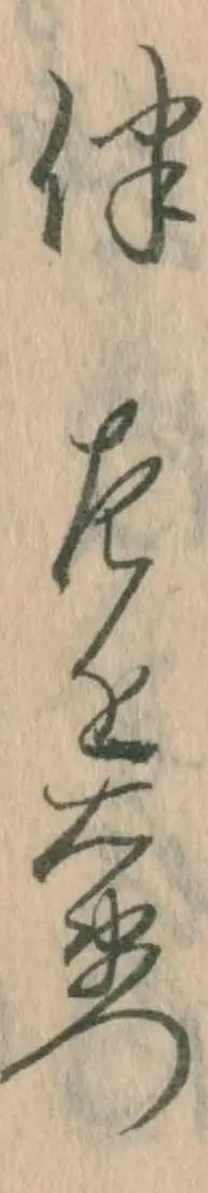伴左近右衛門
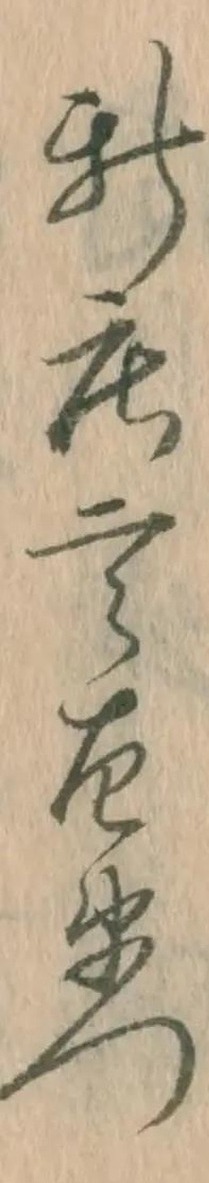新庄二郎左衛門
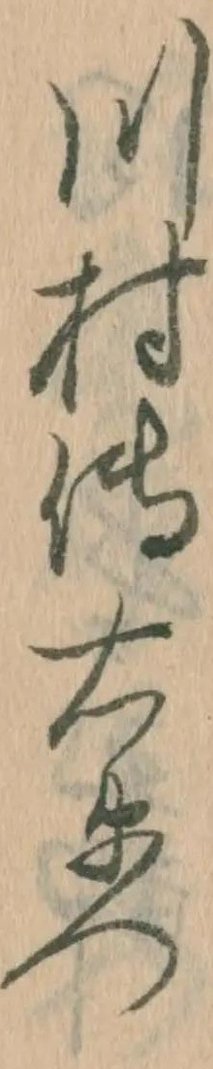川村伝右衛門
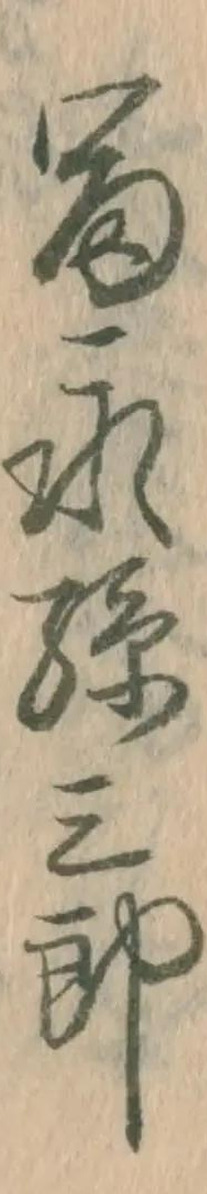冨永孫三郎
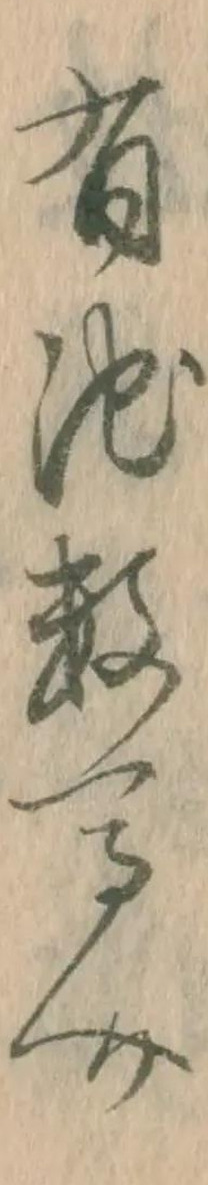有池数馬介
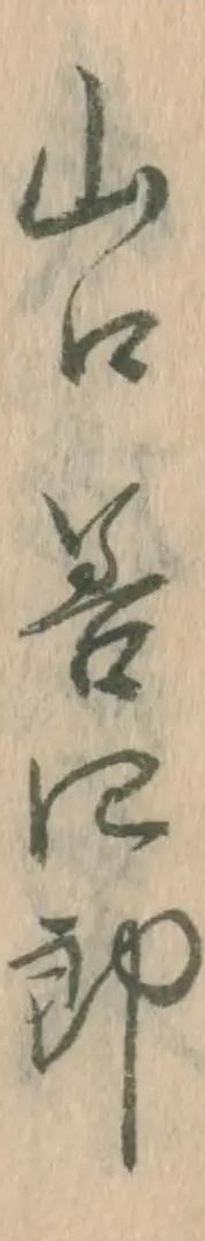山口善四郎
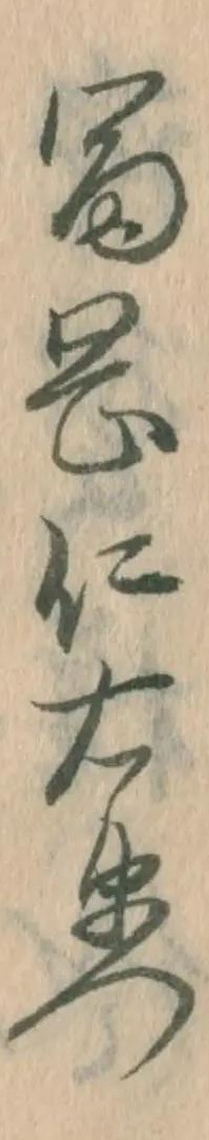冨岡仁右衛門
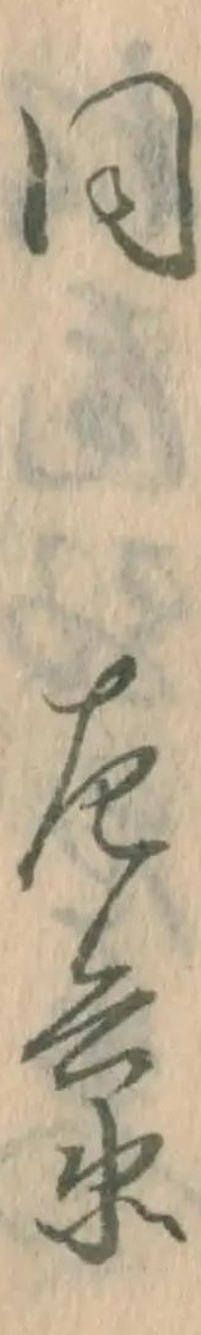同左兵衛

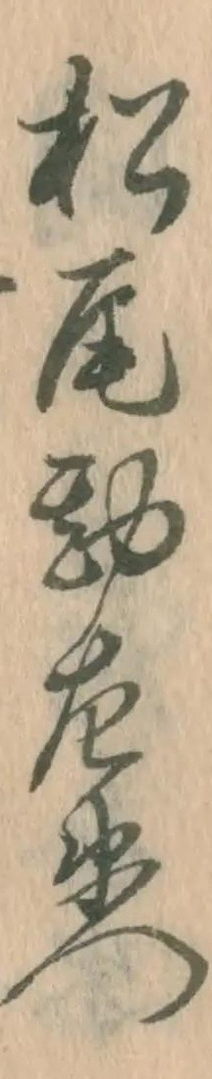松尾勘左衛門
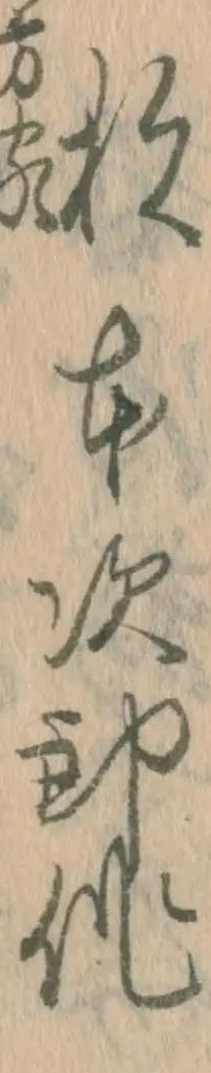杉本次郎作
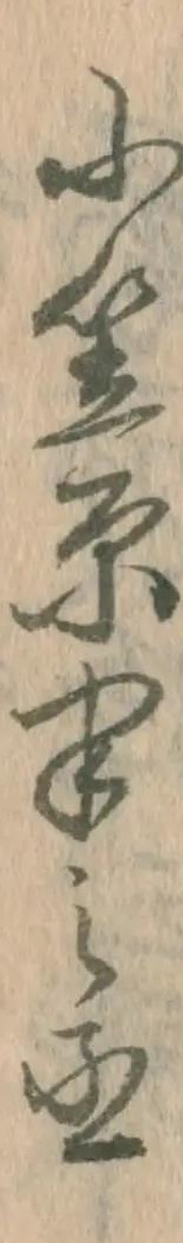分捕小笠原半之丞

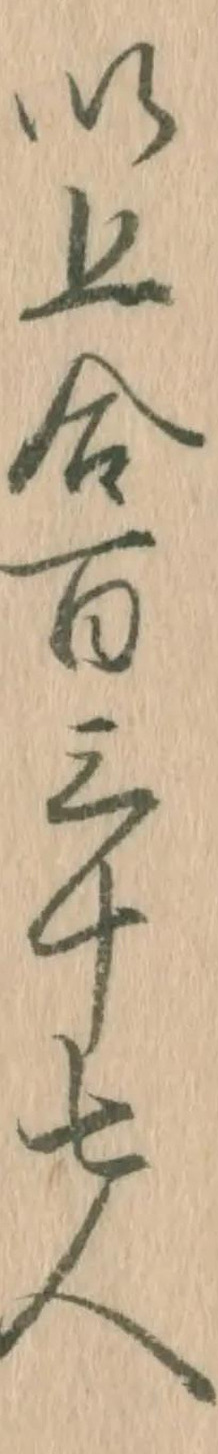以上合百三十七人
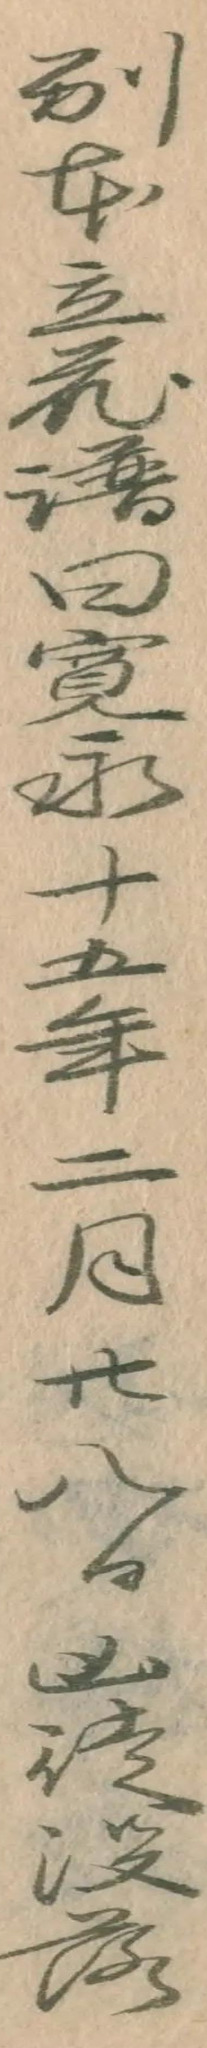別本立花譜曰寛永十五年二月廿八日凶徒没落
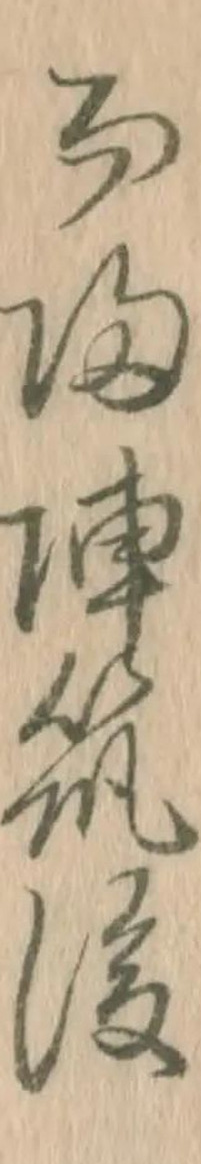而帰陣筑後
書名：切支丹御退治記 49巻. [9]
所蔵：国立国会図書館 National Diet Library, JAPAN
